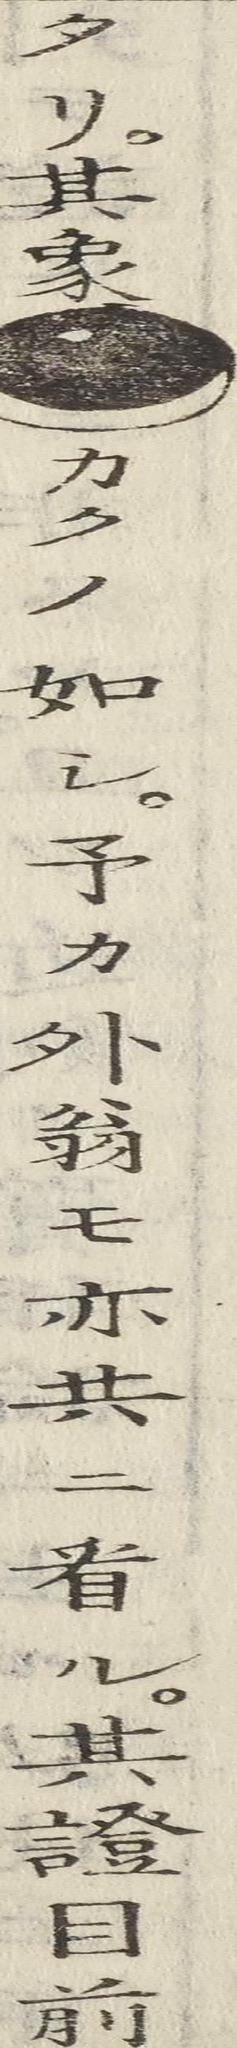タリ。其象カクノ如シ。予カ外翁モ亦共ニ看ル。其証目前
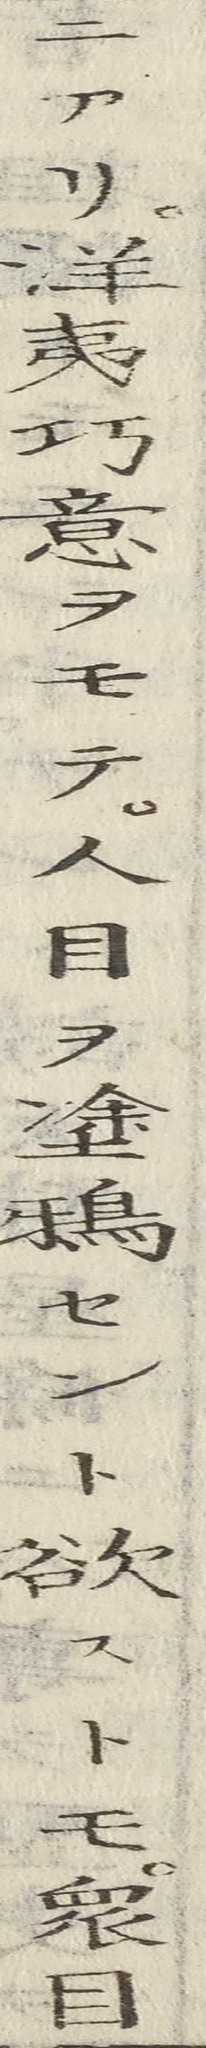ニアリ。洋夷巧意ヲモテ。人目ヲ塗鴉セント欲ストモ。衆目
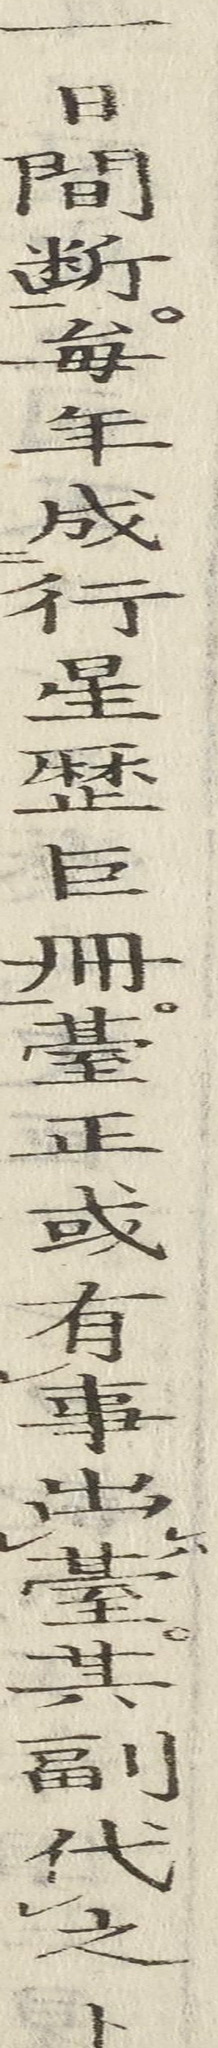一日間断。毎年成ニ行星歴巨冊。台正或有事出台。其副代之ト
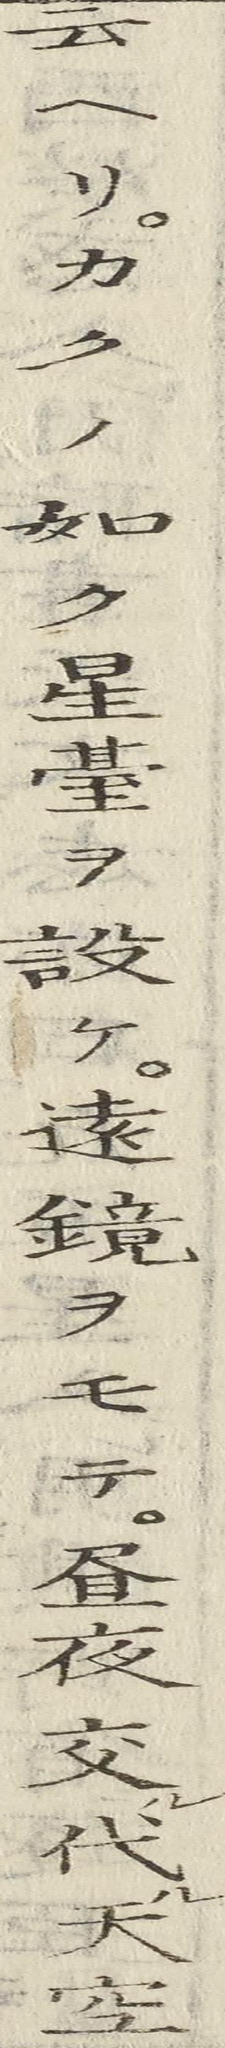云ヘリ。カクノ如ク星台ヲ設ケ。遠鏡ヲモテ。昼夜交代天空
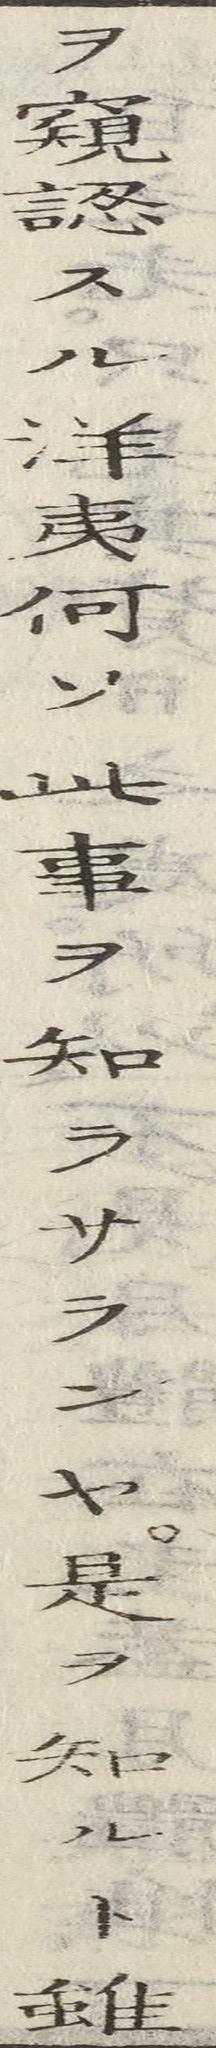ヲ窺認スル洋夷何ソ此事ヲ知ラサランヤ。是ヲ知ルト雖
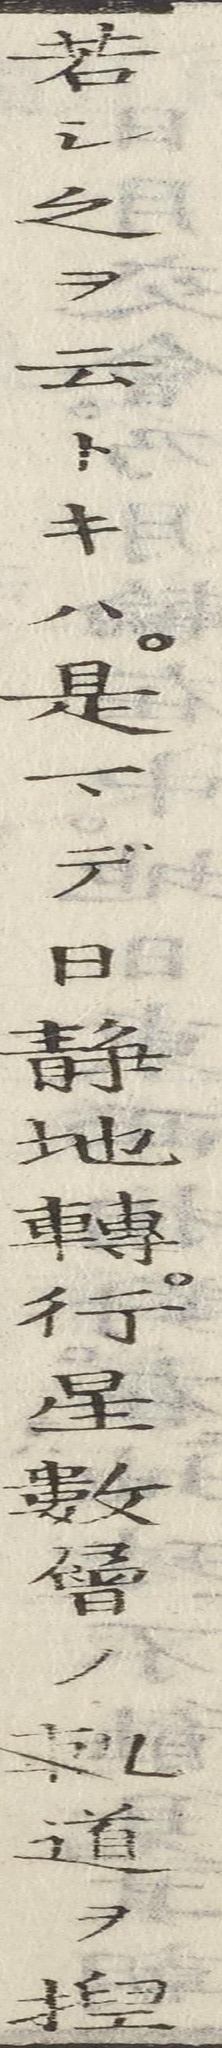若シ之ヲ云トキハ。是マデ日静地転。行星数層ノ軌道ヲ捏
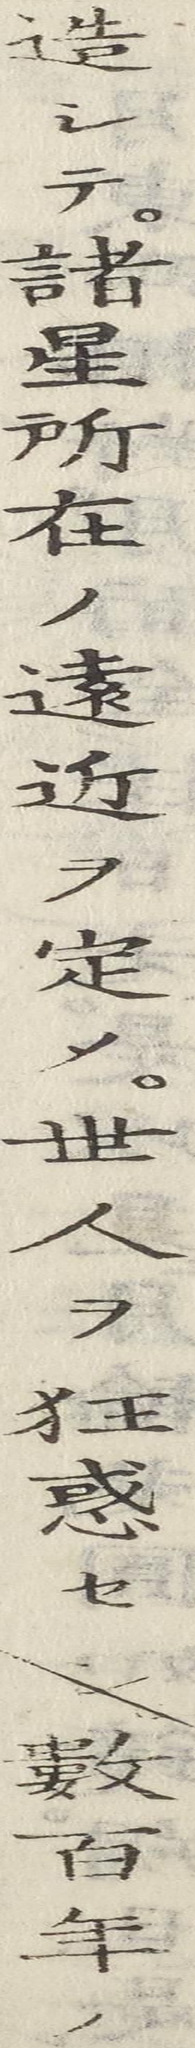造シテ。諸星所在ノ遠近ヲ定メ。世人ヲ狂惑セン数百年ノ
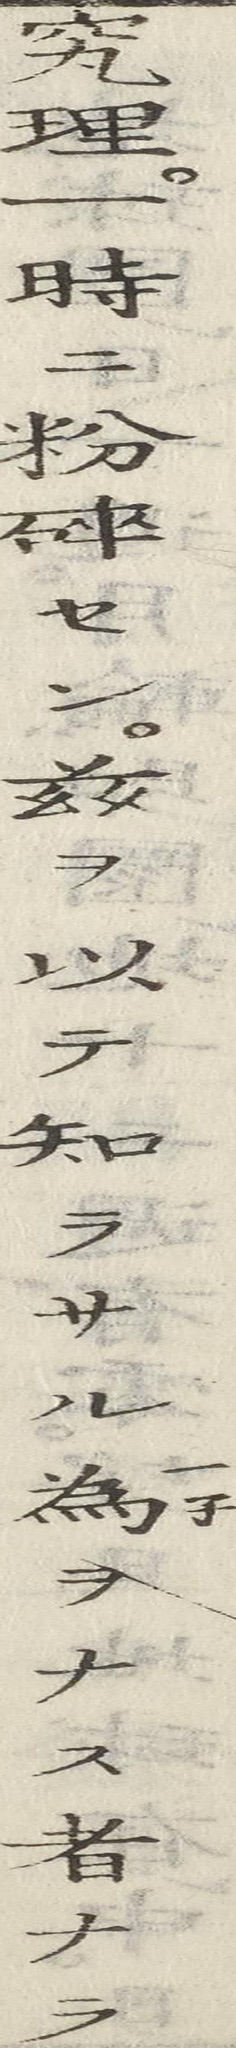究理。一時ニ粉砕セン。茲ヲ以テ知ラサル為ヲナス者ナラ
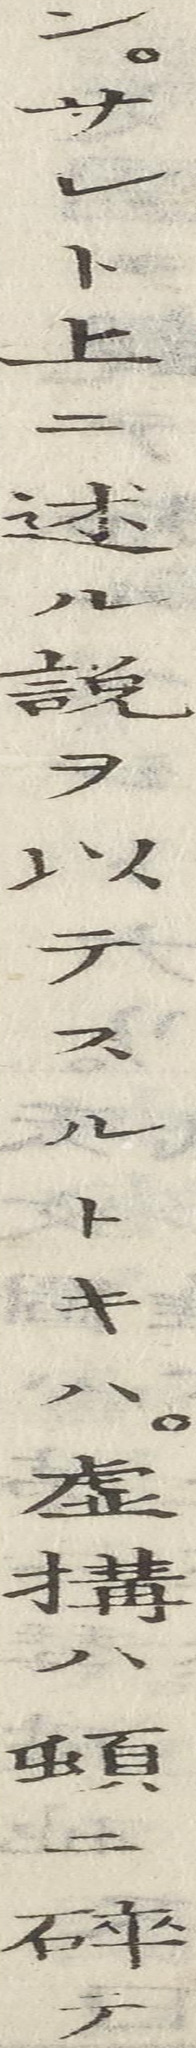ン。サレト上ニ述ル説ヲ以テスルトキハ。虚構ハ頓ニ砕テ
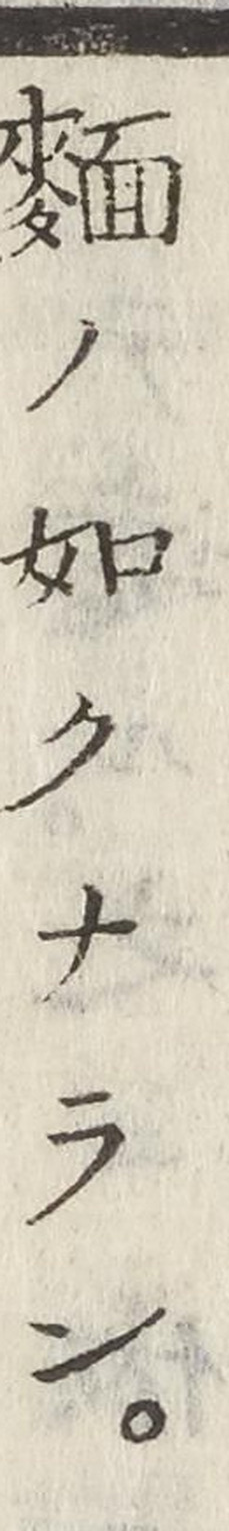麺ノ如クナラン。
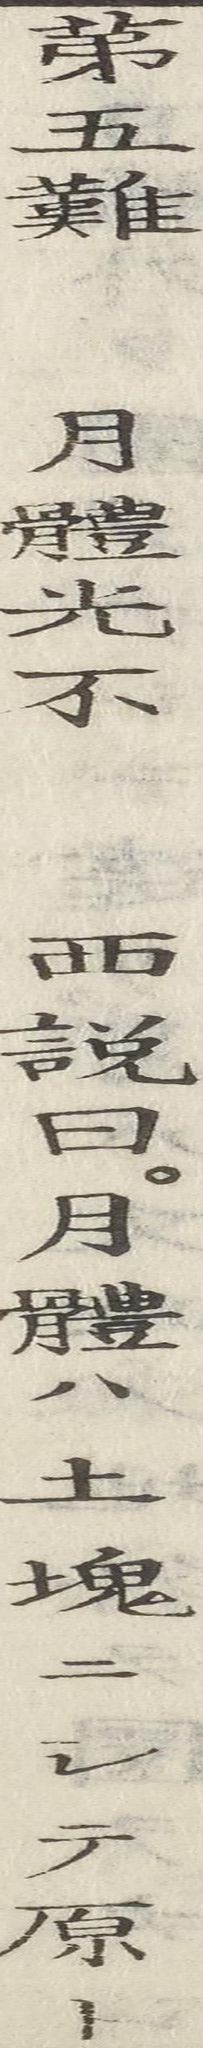第五難月体光不西説曰。月体ハ土塊ニシテ原ト
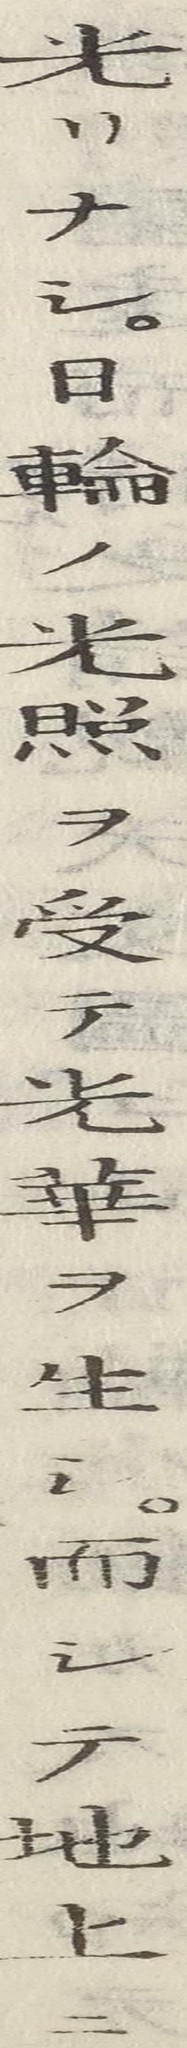光リナシ。日輪ノ光照ヲ受テ光華ヲ正シ。而シテ地上ニ

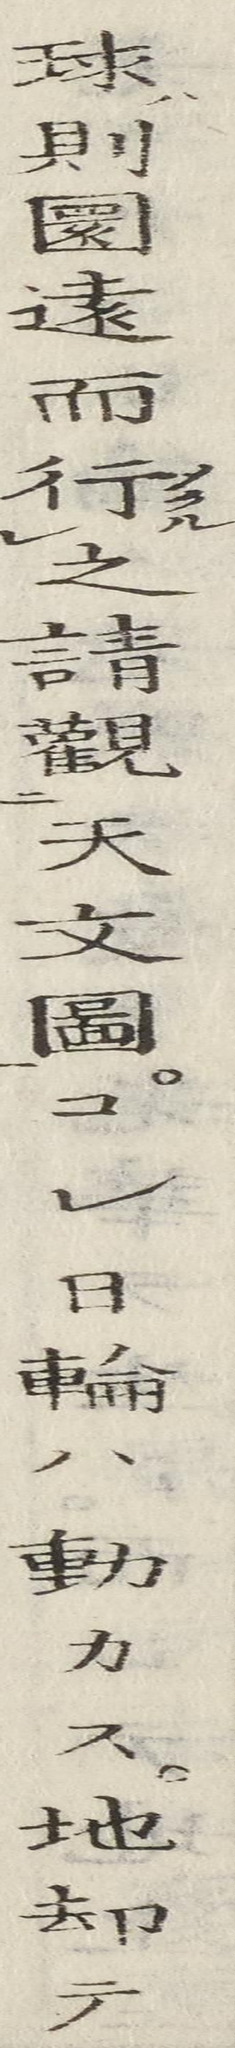球則園遠而行之請観ニ天文図。コレ日輪ハ動カス。地却テ
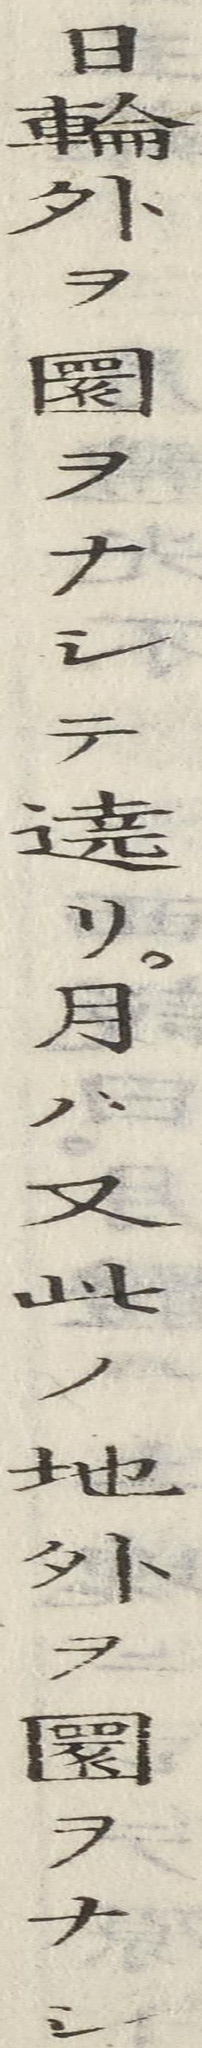日輪外ヲ園ヲナシテ遶リ。月ハ又此ノ地外ヲ園ヲナシ
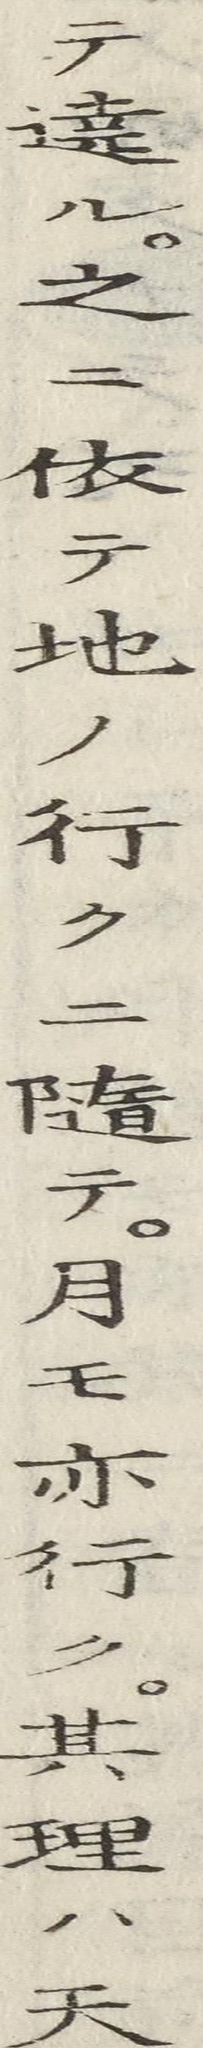テ遶ル。之ニ依テ地ノ行クニ随テ。月モ亦行ク。其理ハ天
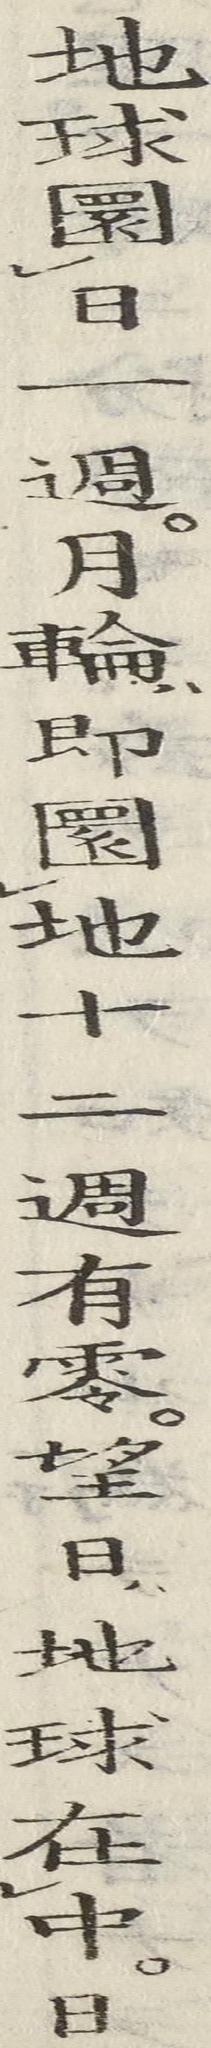地球園日一週。月輪即園地十二週有零。望日地球在中。日
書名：護法新論　二編　下
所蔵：東京大学地震研究所図書室 Earthquake Research Institute Library, The University of Tokyo, JAPAN
